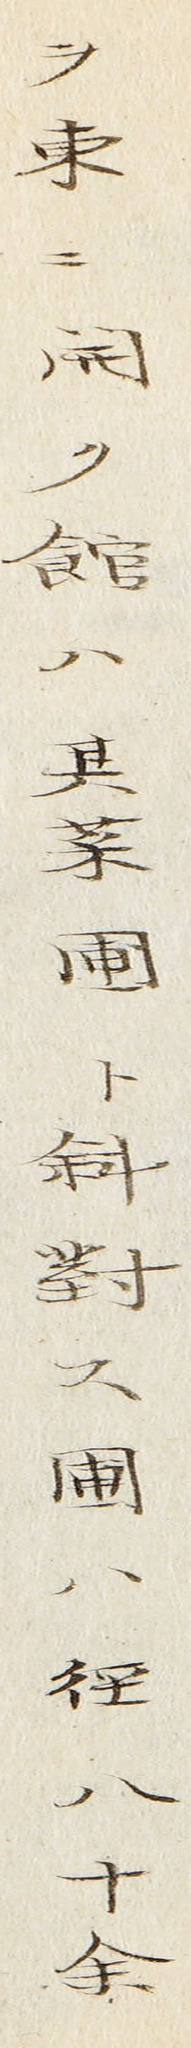ヲ東ニ開ク館ハ其菜圃ト斜対ス圃ハ径ハ八十余
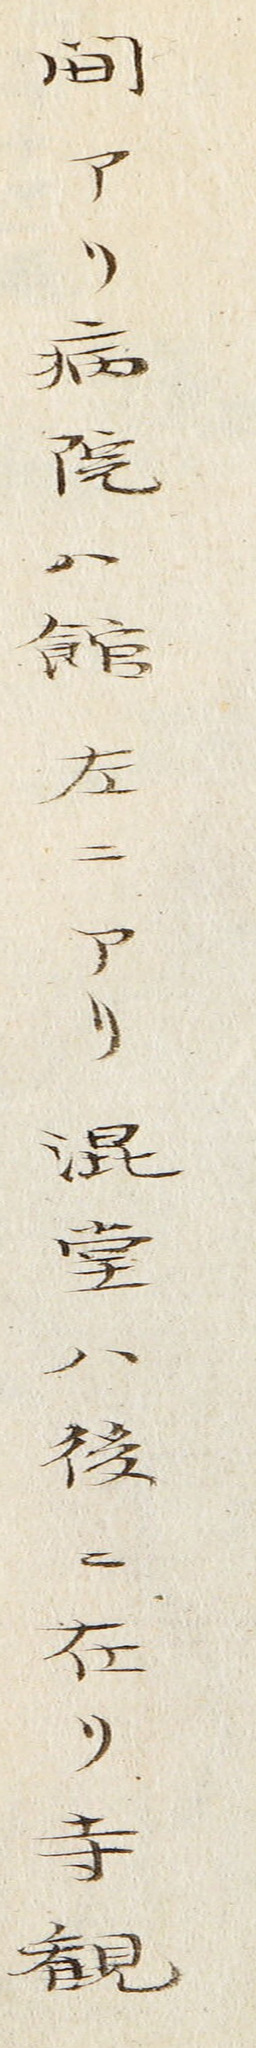間アリ病院ハ館左ニアリ混堂ハ後ニ在リ寺観
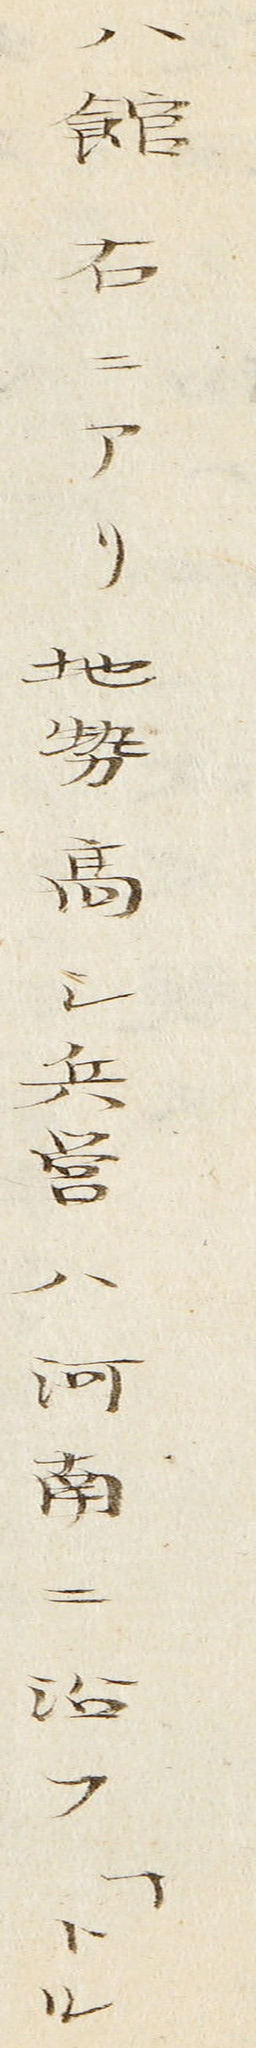ハ館右ニアリ地勢高シ兵営ハ河南ニ沿フ「トル
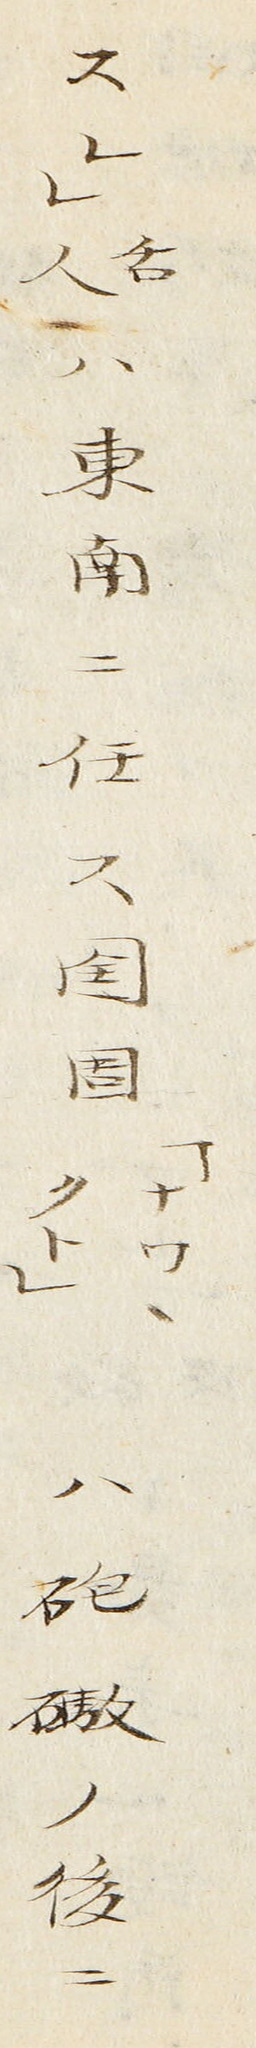スレ」舌人ハ東南ニ任ス圄「ナワ、クト」ハ砲礟ノ後ニ
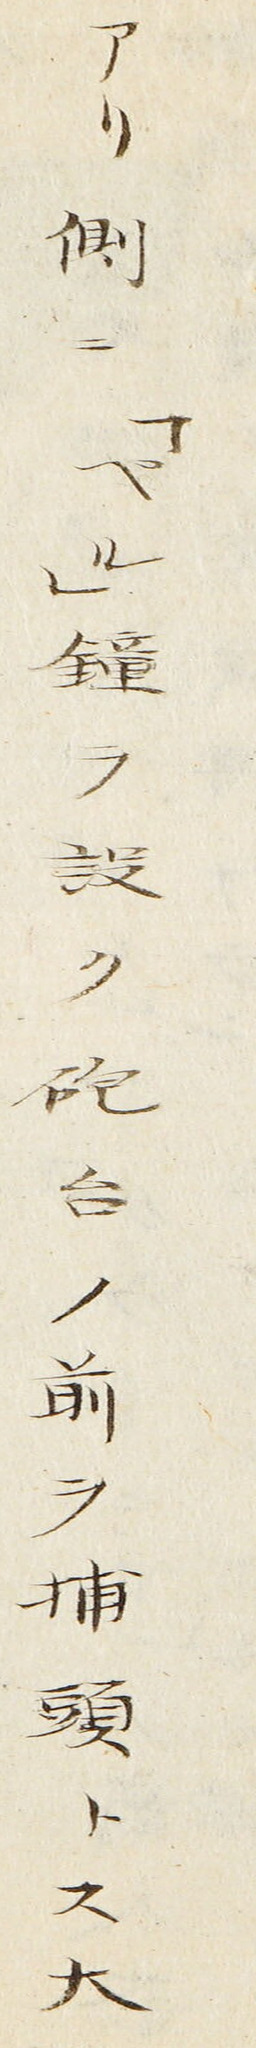アリ側ニ「ペル」鐘ヲ設ク砲台ノ前ヲ捕頭トス大
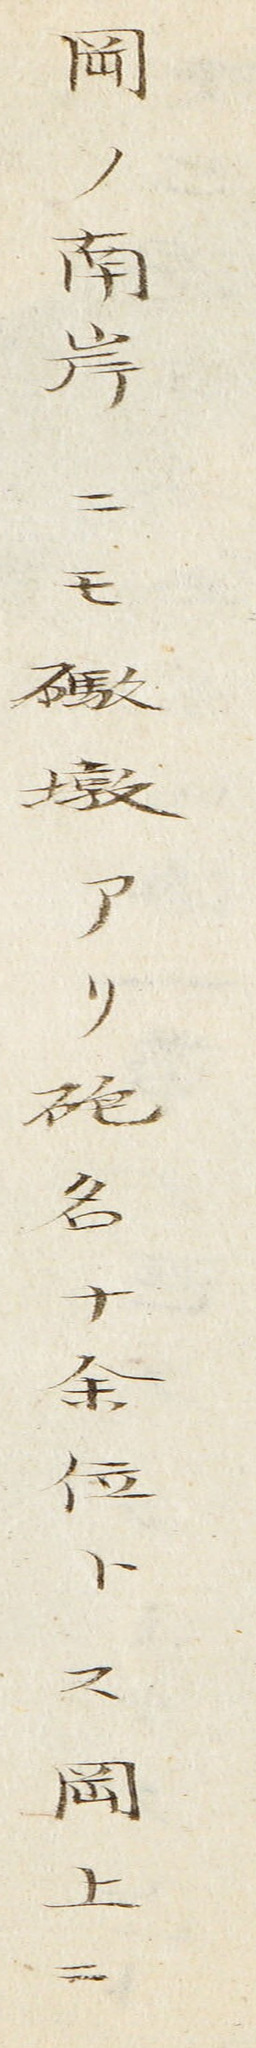岡ノ南岸ニモ礟墩アリ砲名十余位トス岡上ニ
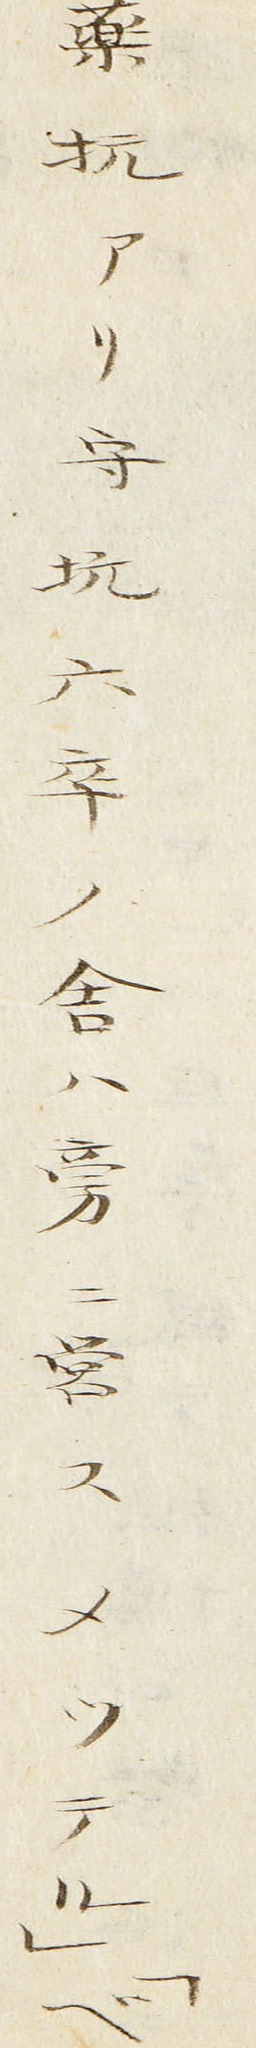薬抗アリ守坑六卒ノ舎ハ旁ニ営スメツテル」「ベ
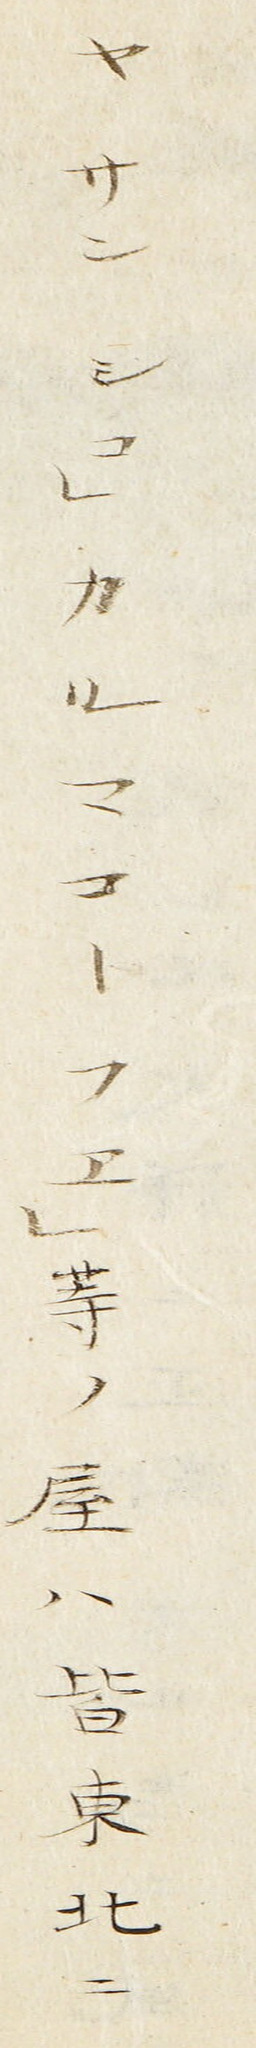ヤサンシコ」カルマコーフヱ」等ノ屋ハ皆東北ニ
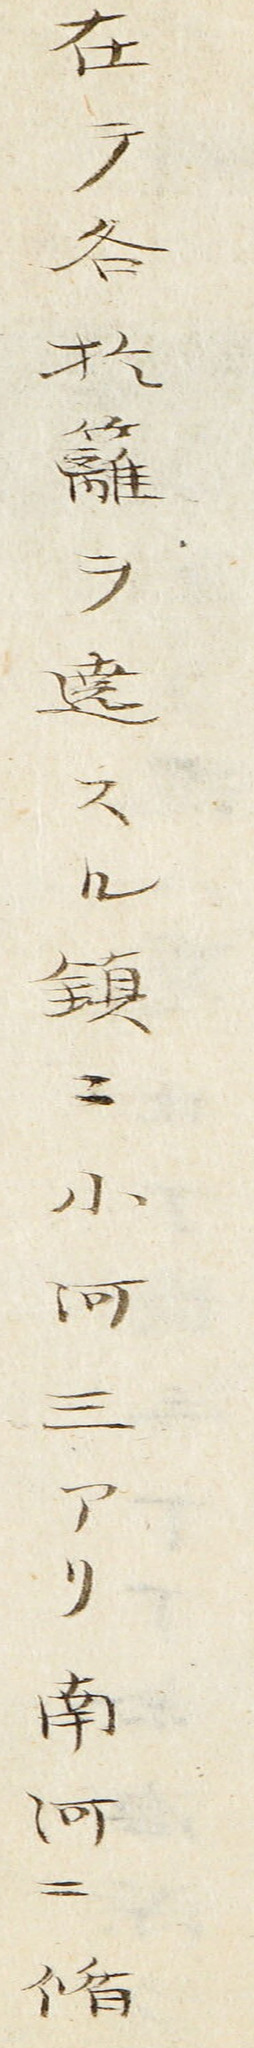在テ各圪籬ヲ遶スル鎮ニ小河三アリ南河ニ修
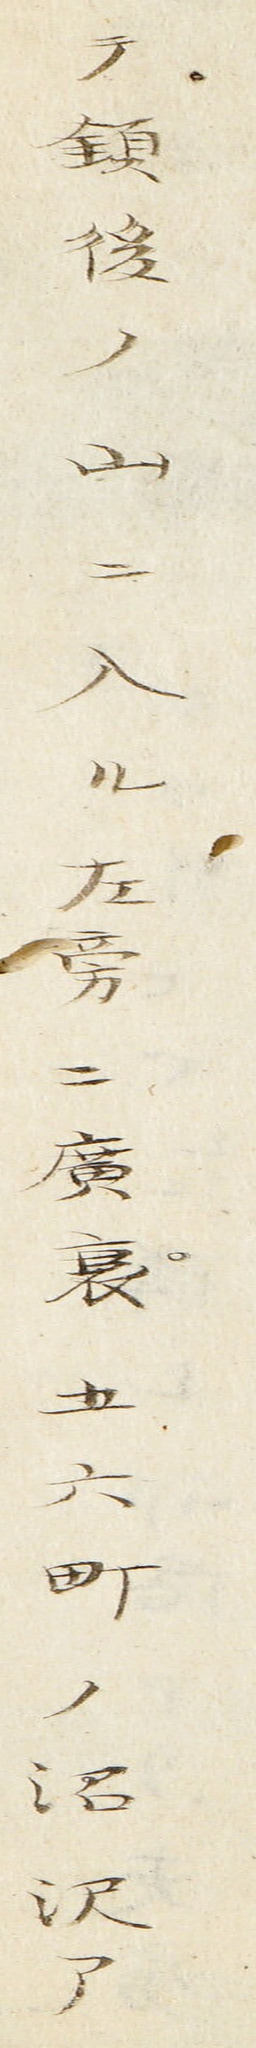テ鎮後ノ山ニ入ル左旁ニ広衰五六町ノ沼沢ア
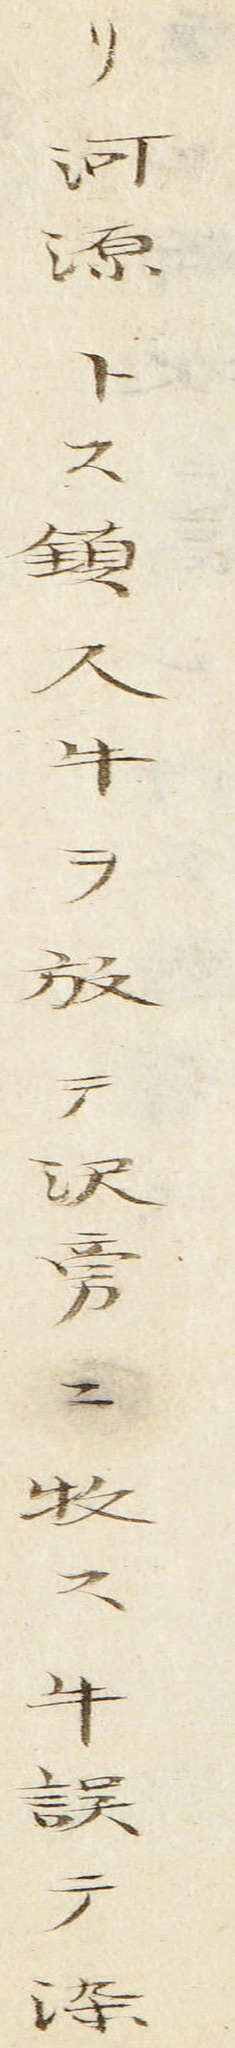リ河源トス鎮人牛ヲ放テ沢旁ニ牧ス牛誤テ深
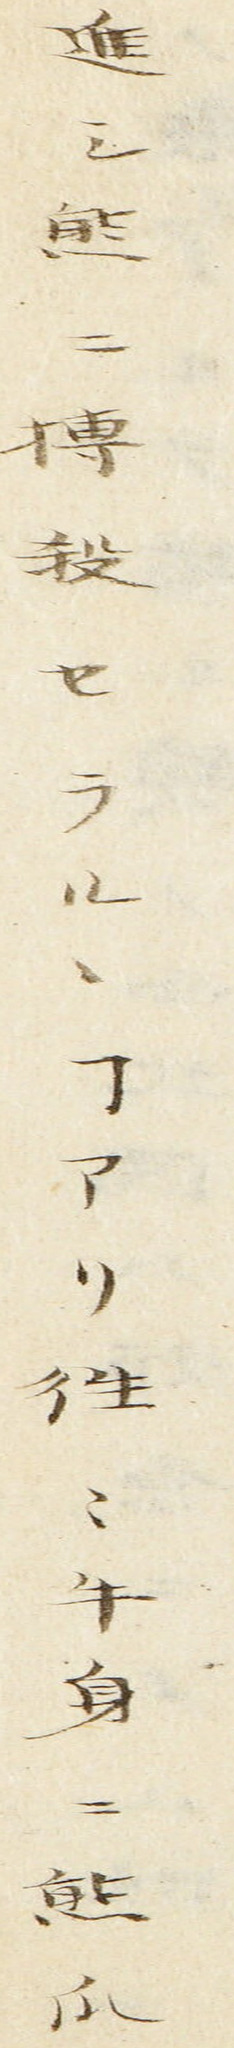進シ熊ニ搏殺セラルゝコトアリ往々牛身ニ熊爪

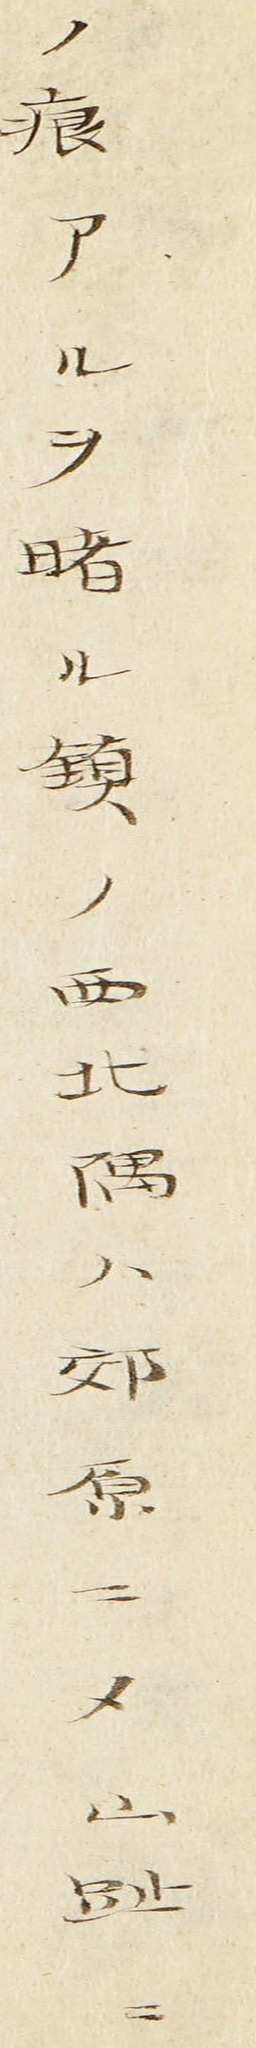ノ痕アルヲ睹ル鎮ノ西北隅ハ郊原ニシテ山趾ニ
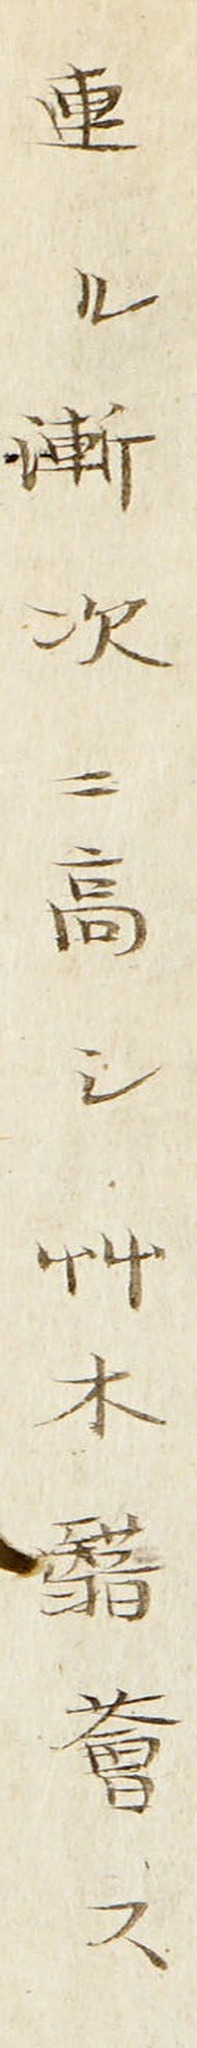連ル漸次ニ高シ艸木薈ス
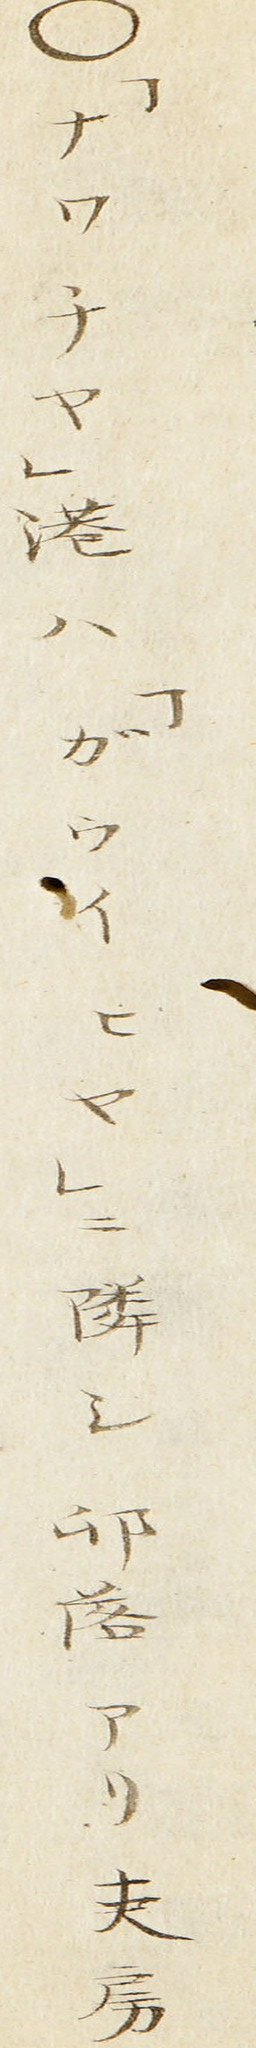○「ナワチヤ」港ハ「ガウイヒヤ」ニ隣シ邨落アリ吏房
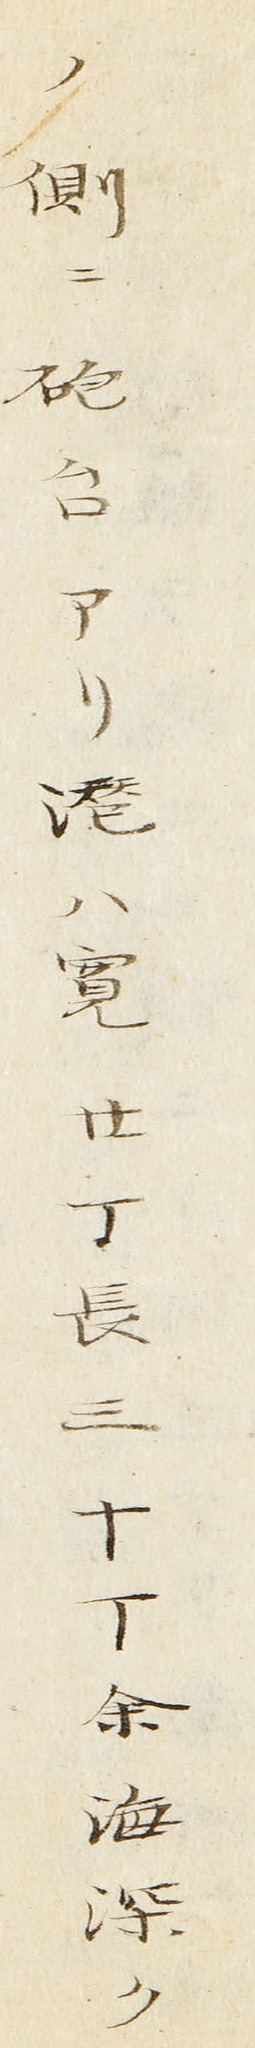ノ側ニ砲台アリ港ハ寛廿丁長三十丁余海深ク
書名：流蕃通書
